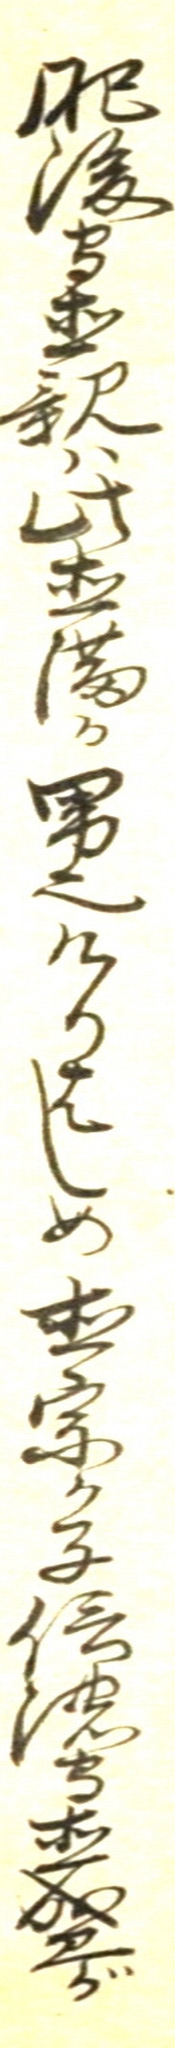肥後守直親は此直満か男也けりはしめ直宗か子信濃守直盛が
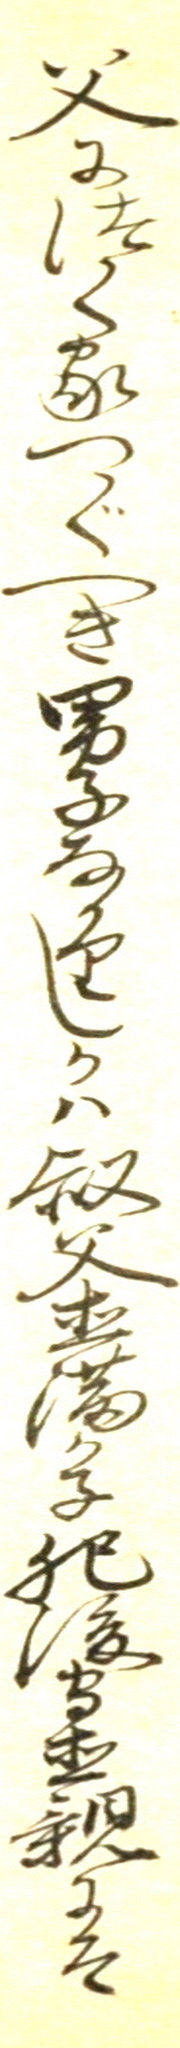父につく家つぐへき男子なかりしかは叔父直満か子肥後守直親にそ
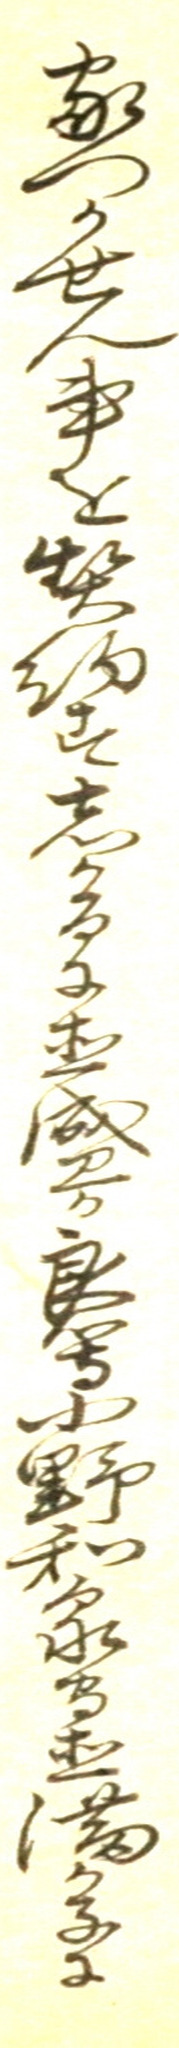家つかせん事を契約すしかるに直盛か郎等小野和泉守直満か子に
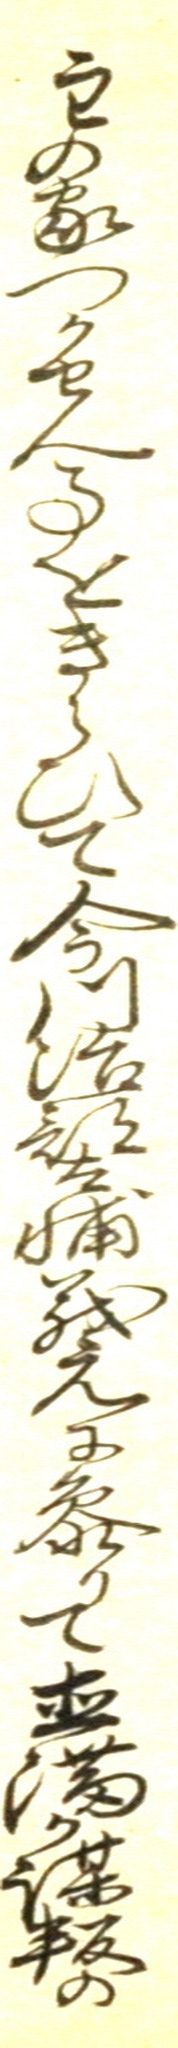主の家つかせん事をきらひて今川治部大輔義元に参りて直満か謀叛の
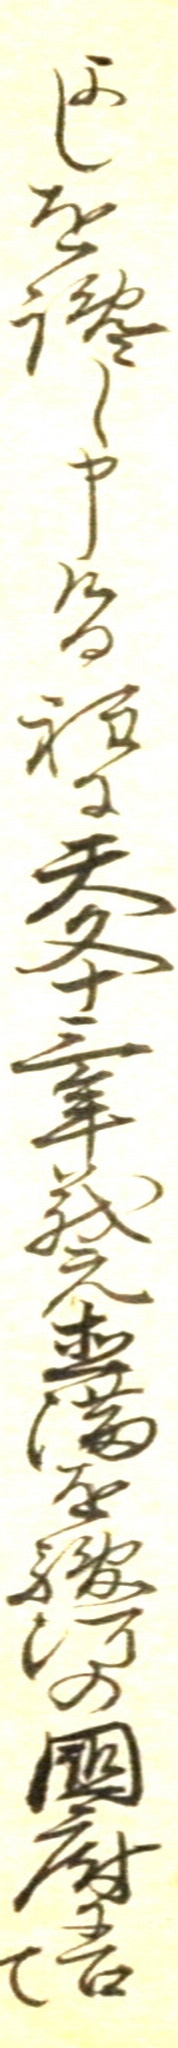よしを讒し申ける程に天文十三年義元直満を駿河の国府に召て
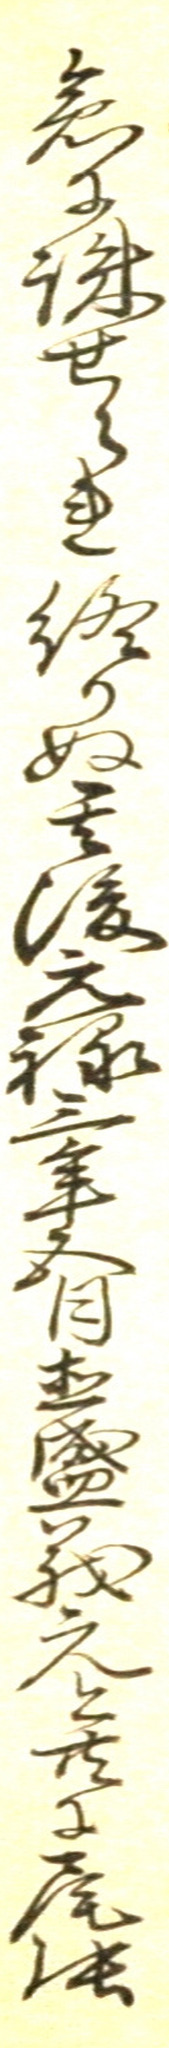急に誅せられ終りぬ其後元禄三年五月直盛義元と共に尾張
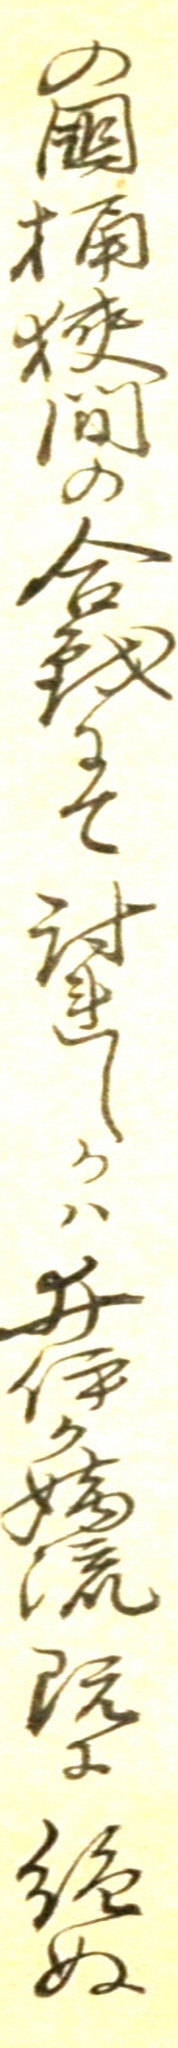の国桶狭間の合戦にて討れしかは井伊か嫡流既に絶ぬ
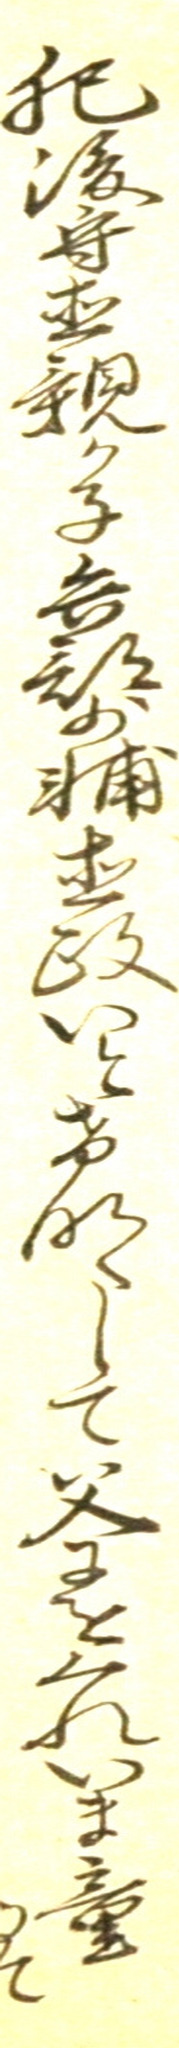肥後守直親か子兵部少輔直政いとけなくして父にをくれいま童にて
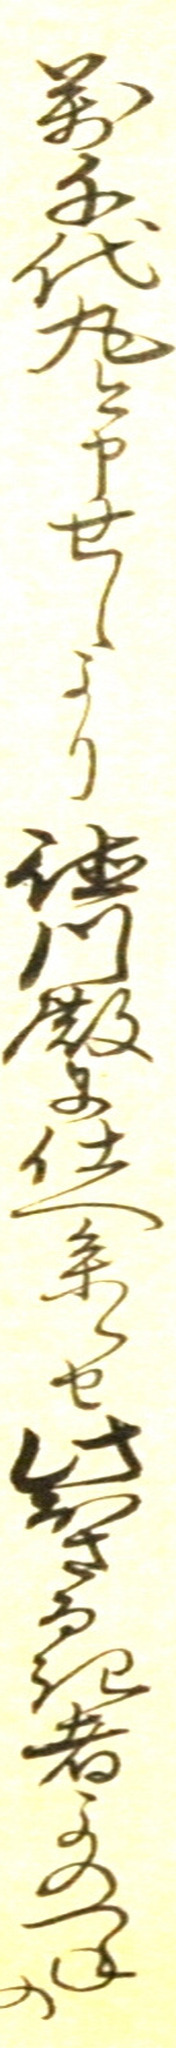万千代丸と申せしより徳川殿に仕へ参らせ此おさなき者よのつねの

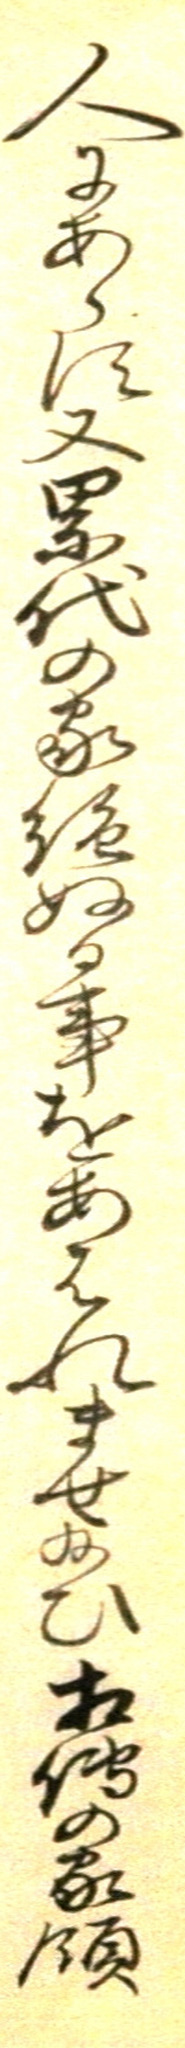人にあらす又累代の家絶ぬる事をあはれませ給ひ相伝の家領
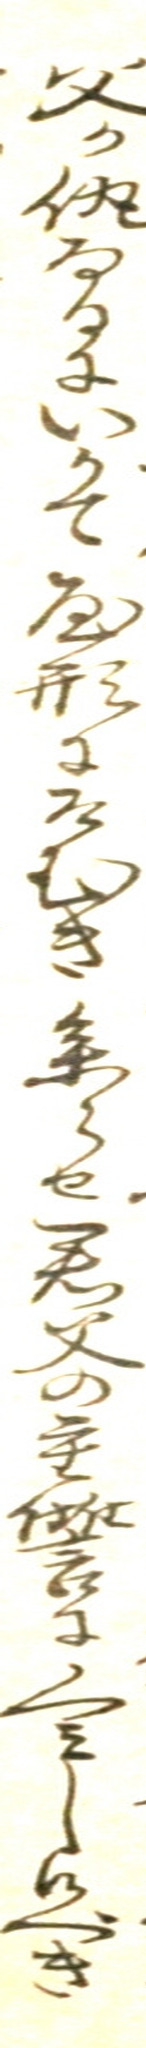父か仇なるにいかて屋形にそむき参らせ君父の重讐にくみし候べき
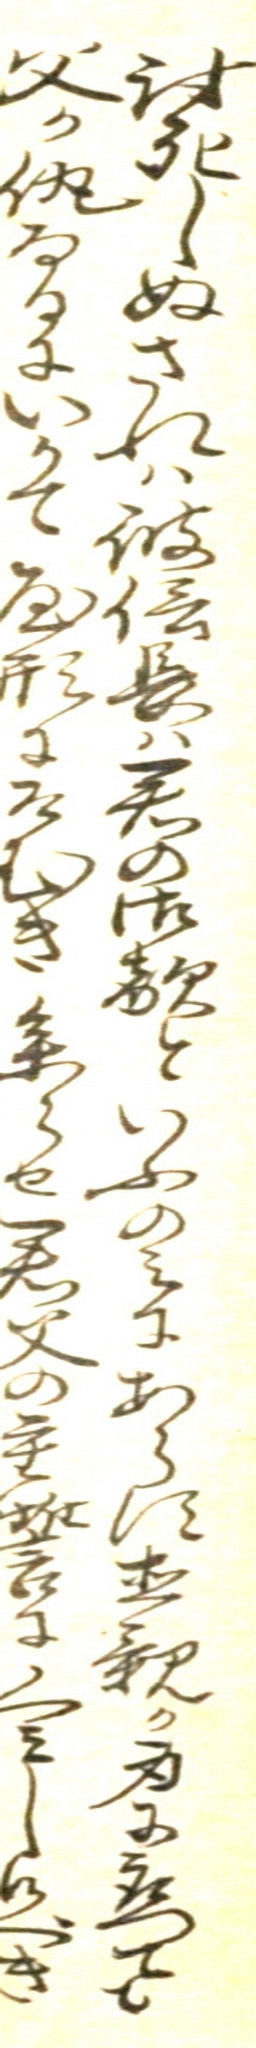父か仇なるにいかて屋形にそむき参らせ君父の重讐にくみし候べき

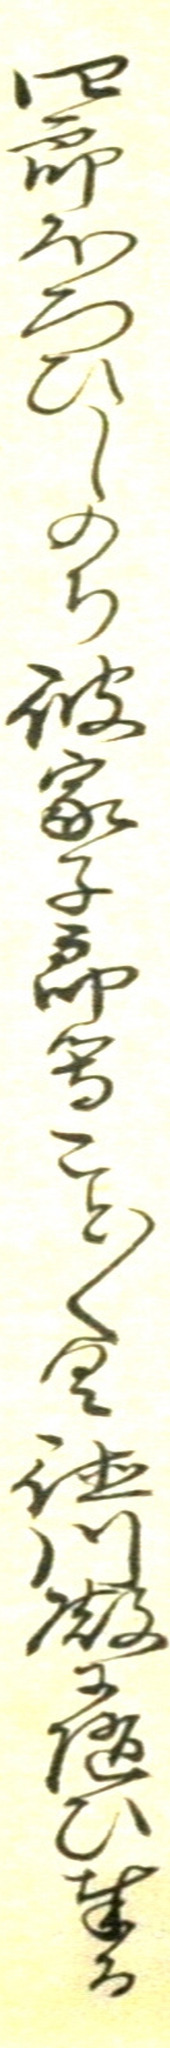四郎ほろひしのち彼家子郎等こと〳〵く徳川殿に随ひ奉る
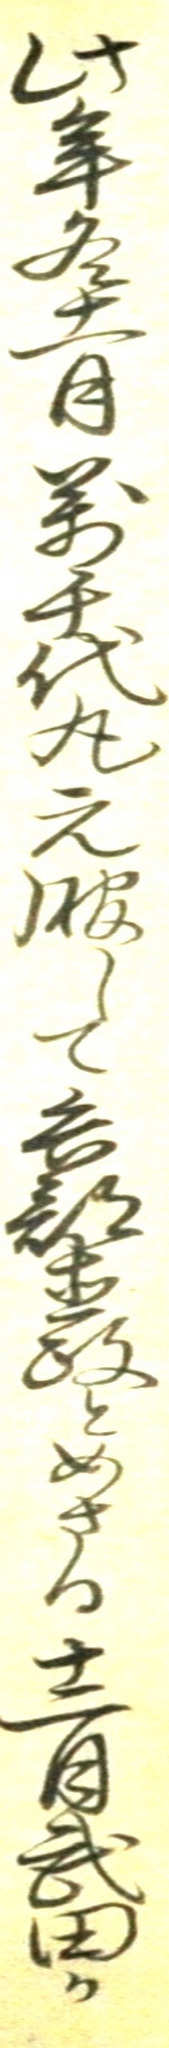此年冬十一月万千代丸元服して兵部直政とめさる十二月武田か
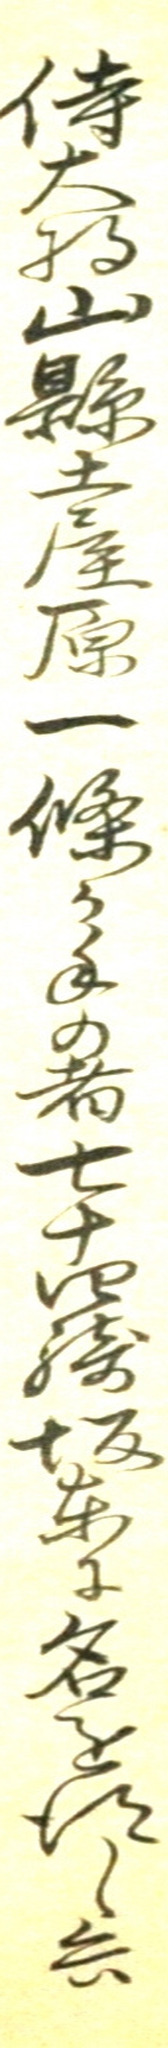侍大将山縣土屋原一条か手の者七十余騎坂東に名を得し兵
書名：藩翰譜（四・上）
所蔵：伊那市立高遠町図書館・合同会社AMANE
